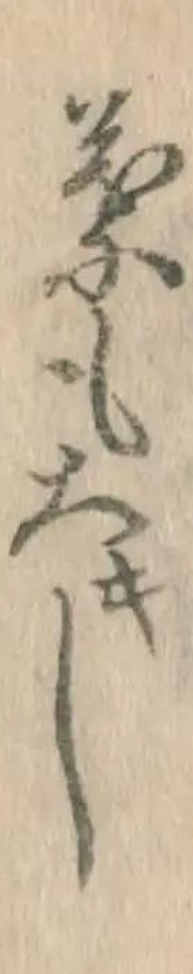葉も大きく
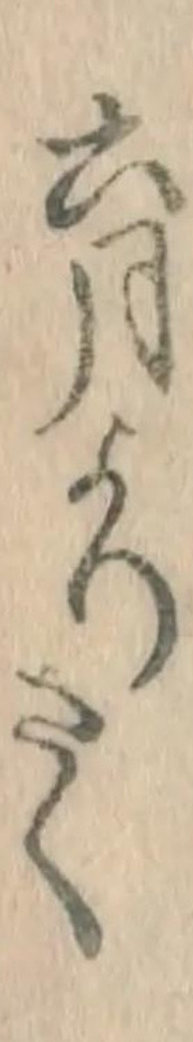六月よりさく

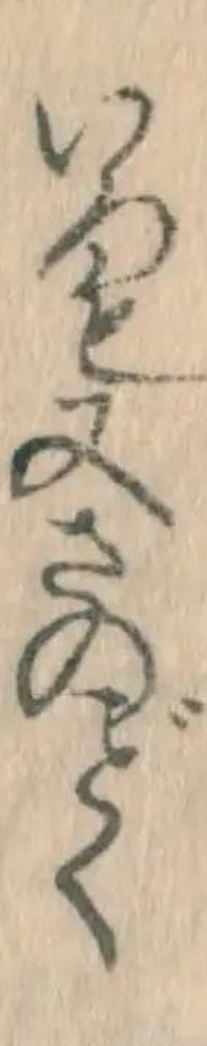いろも又さのごとく
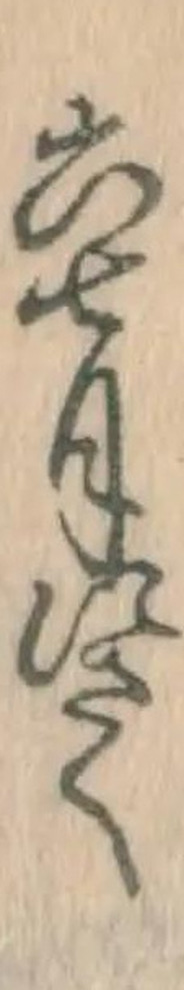六七月にさく
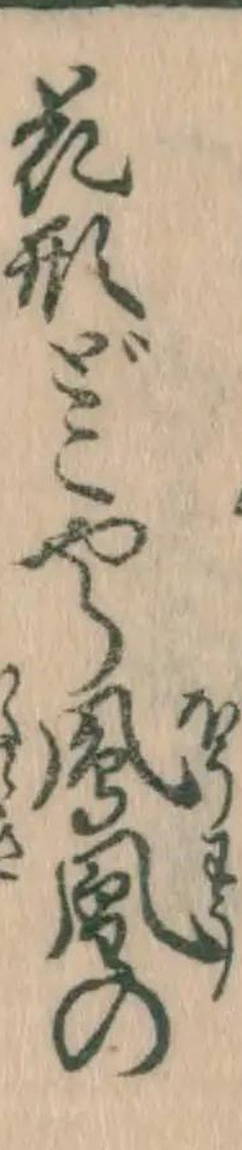花形どこやうの鳳凰の
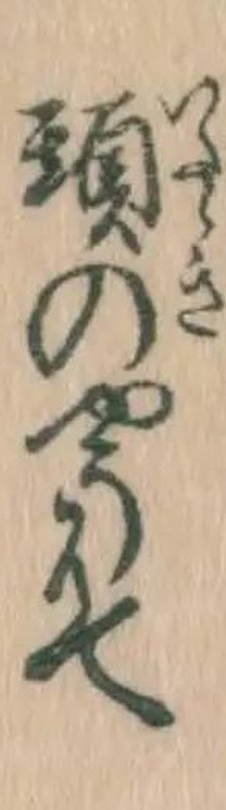頭のやうにて
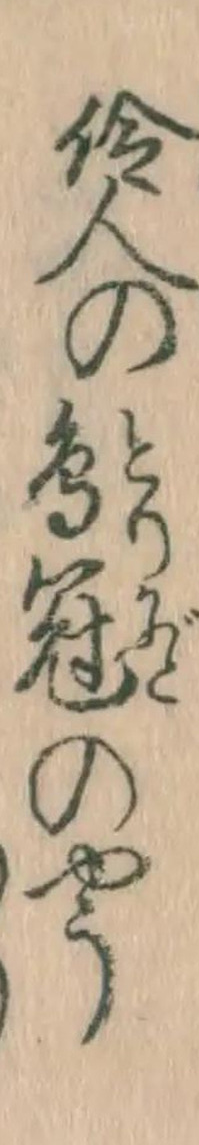伶人の鳥冠のやう
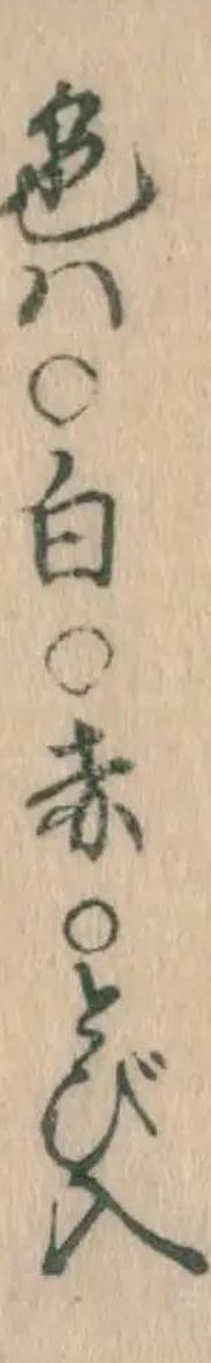色は〇白〇赤〇とび入
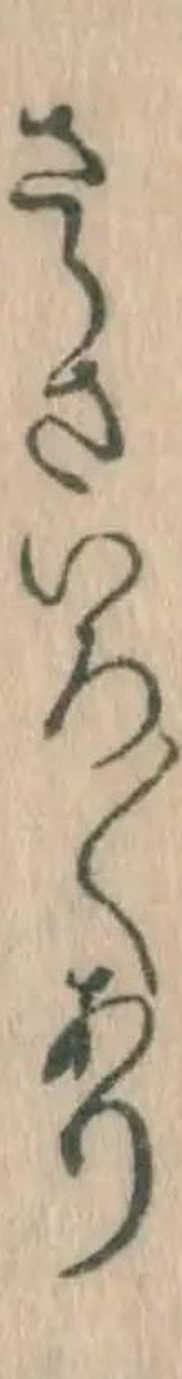さらさいろ〳〵あり
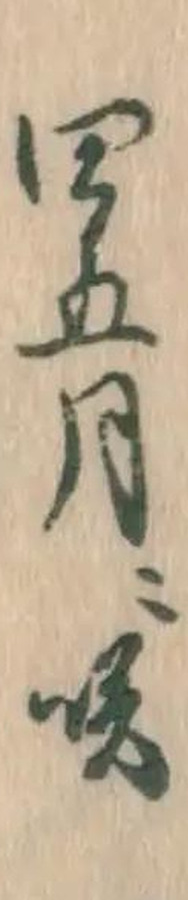四五月に咲

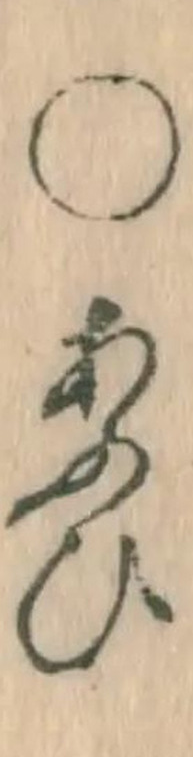〇あふひ
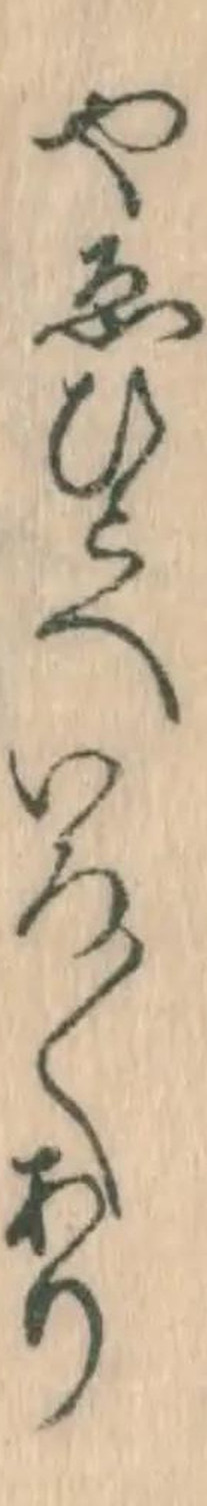やゑひとへいろ〳〵あり
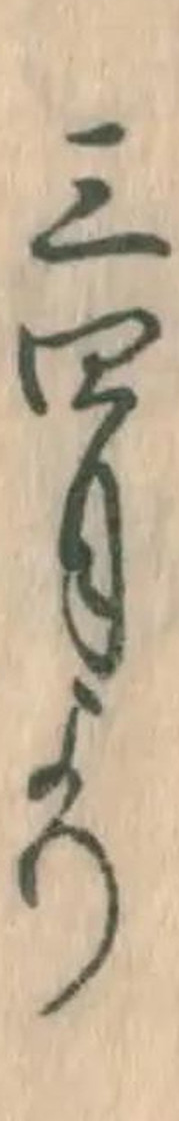三四月より
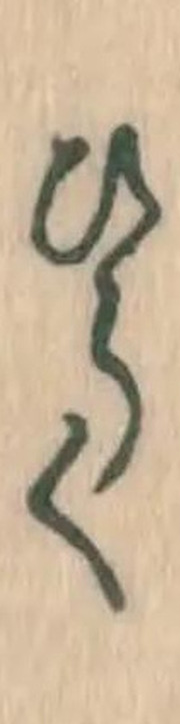ひらく
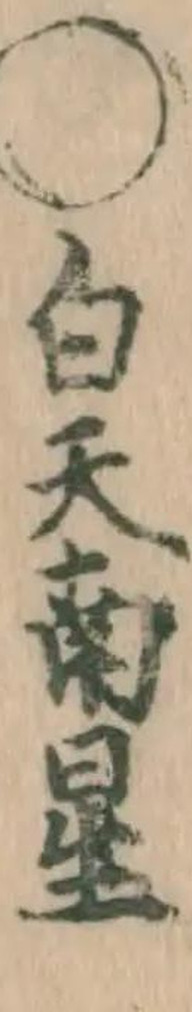〇白天南星
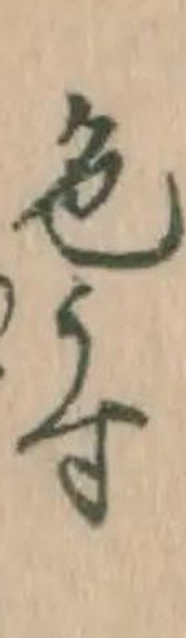色うす
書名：艸花繪前集. [2]
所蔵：国立国会図書館 National Diet Library, JAPAN
